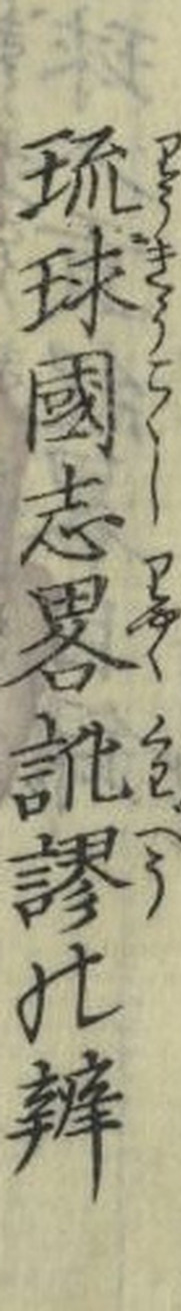琉球国志略訛謬の弁
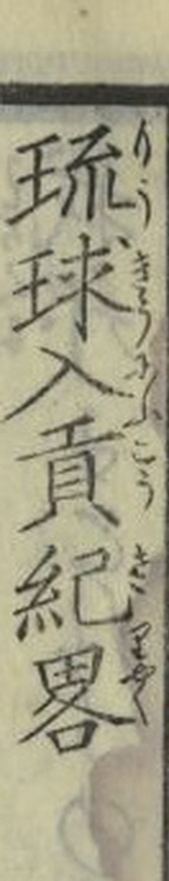琉球入貢紀略
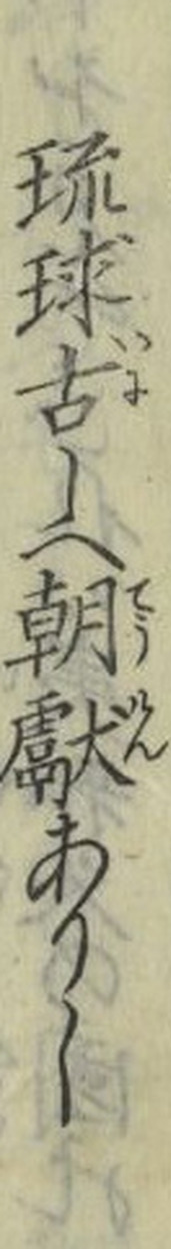琉球古しへ朝献ありし
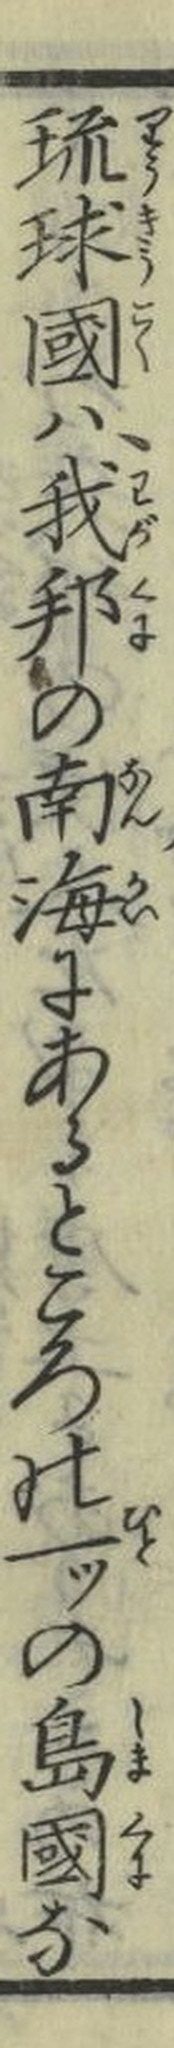琉球国は、吾邦の南海にあるところの一ツの島国な
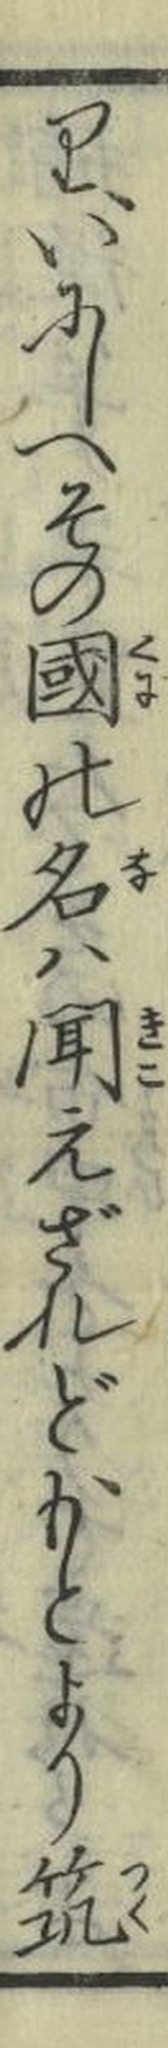り、いにしへその国の名は聞えざれど、もとより筑
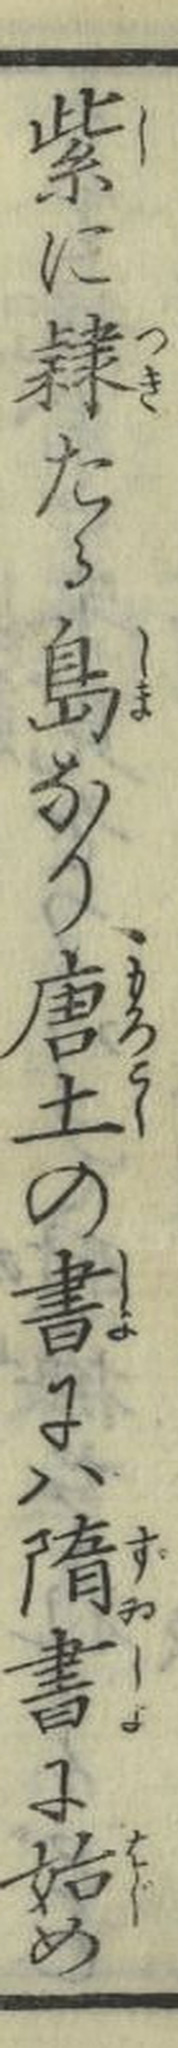紫に隷たる島なり、唐土の書には隋書に始め
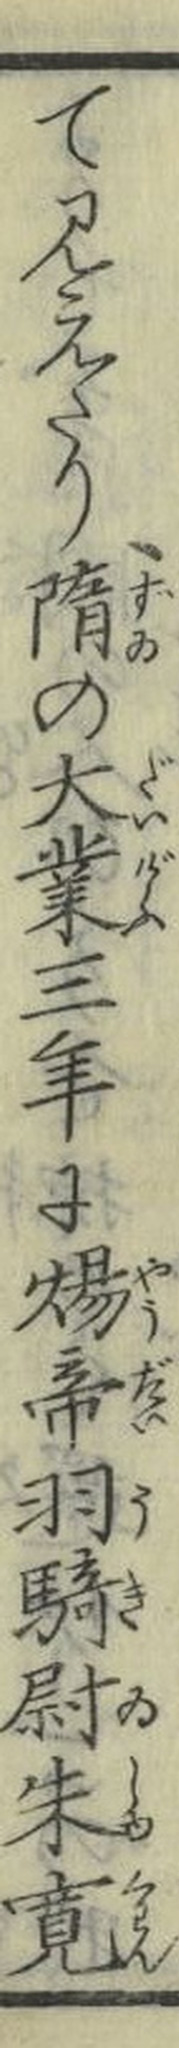て見えたり、隋の大業三年に煬帝羽騎尉朱寛
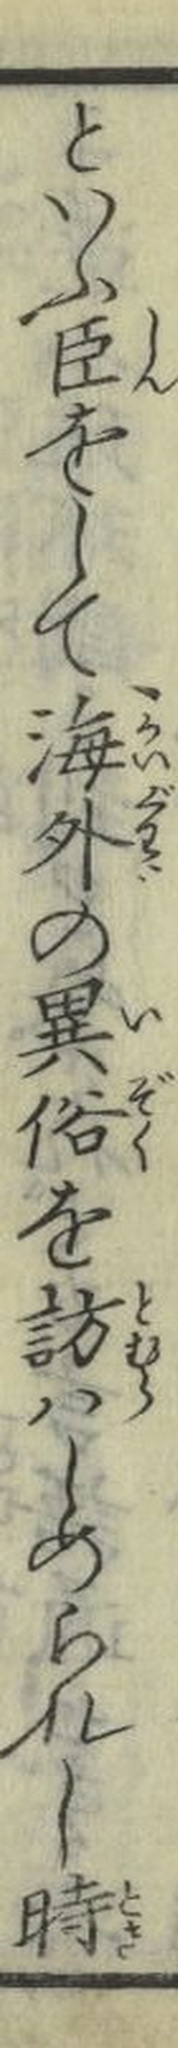といふ臣をして、海外の異俗を訪はしめられし時
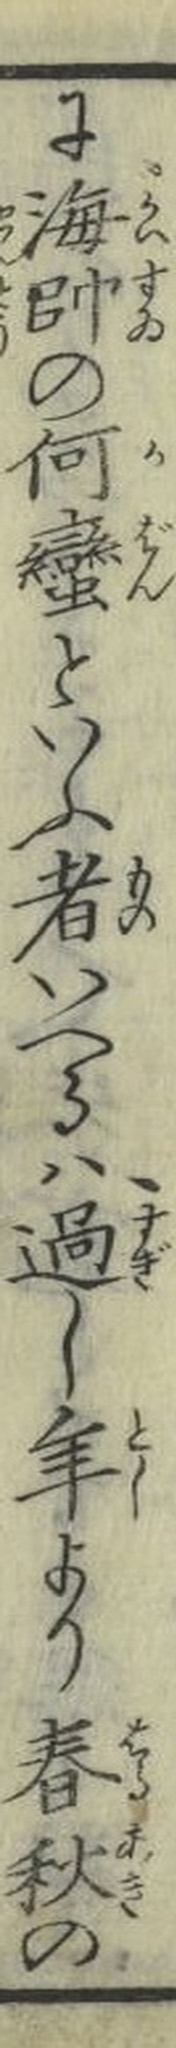に海帥の何蛮という者いへるは、過し年より春秋の
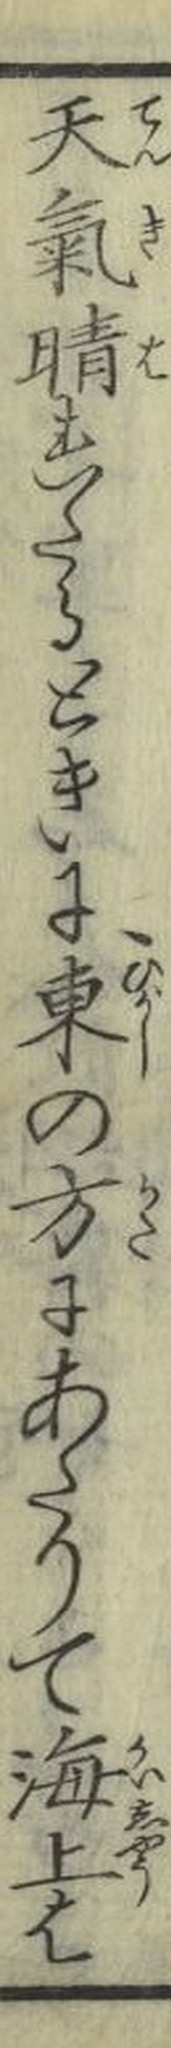天気晴れたるときに、東の方にあたりて海上は

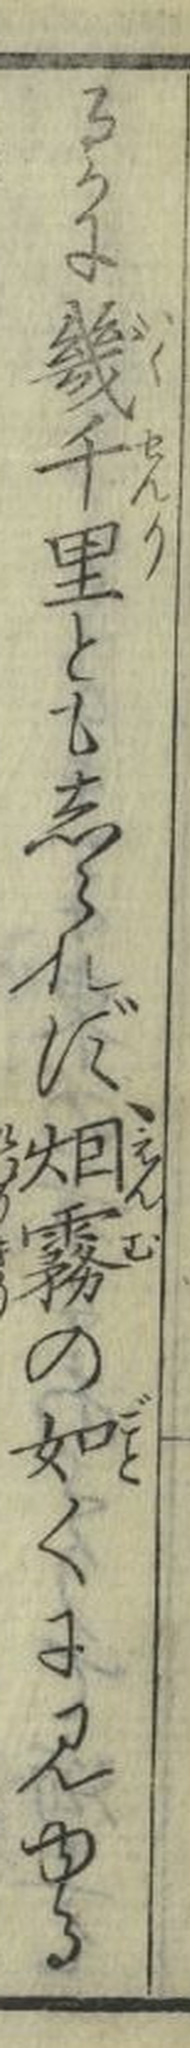るかに幾千里ともしられず、煙霧の如くに見ゆる
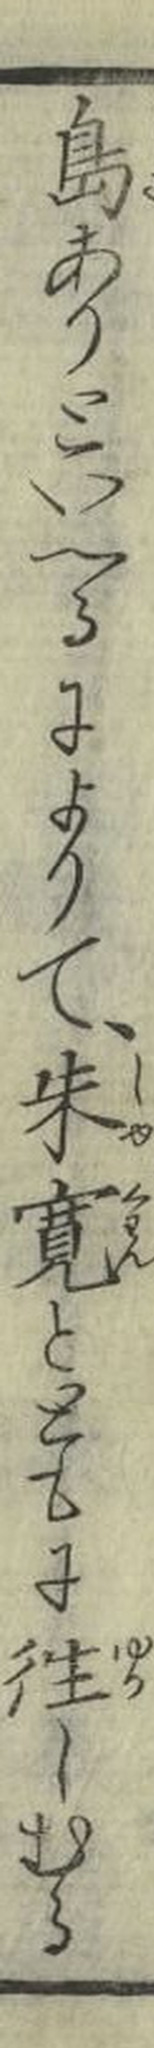島ありといへるによりて、朱寛とともに往しむる
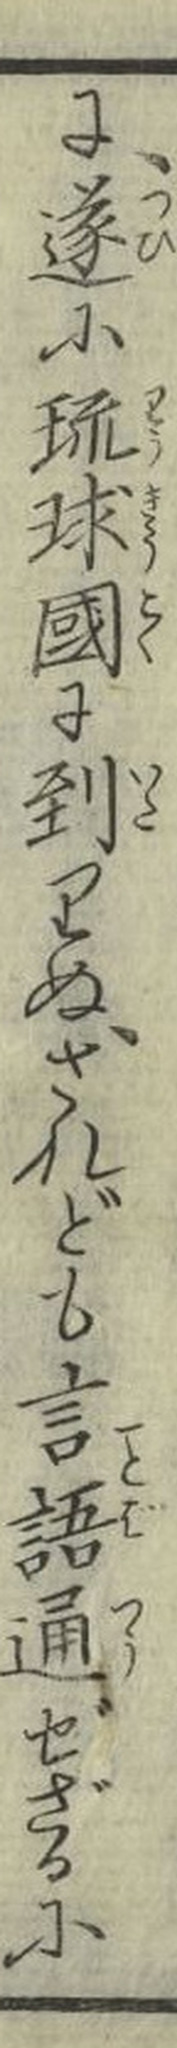に、遂に琉球国に到りぬ、されども言語通ぜざるに
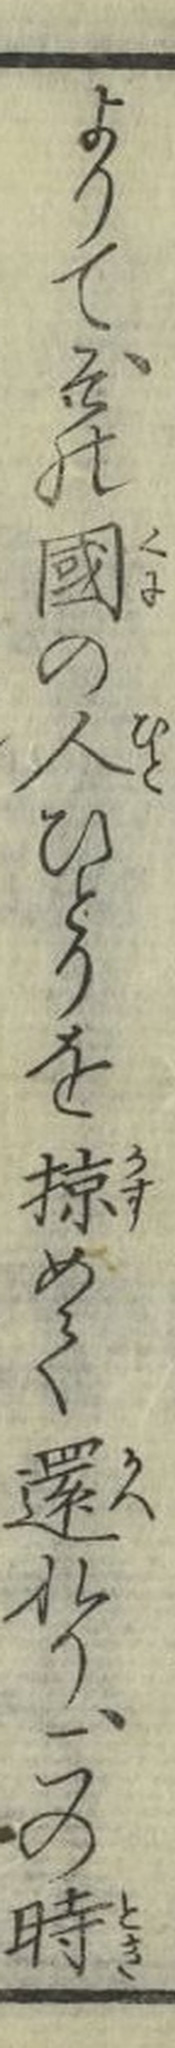よりて、その国の人ひとりを掠めて還れり、この時
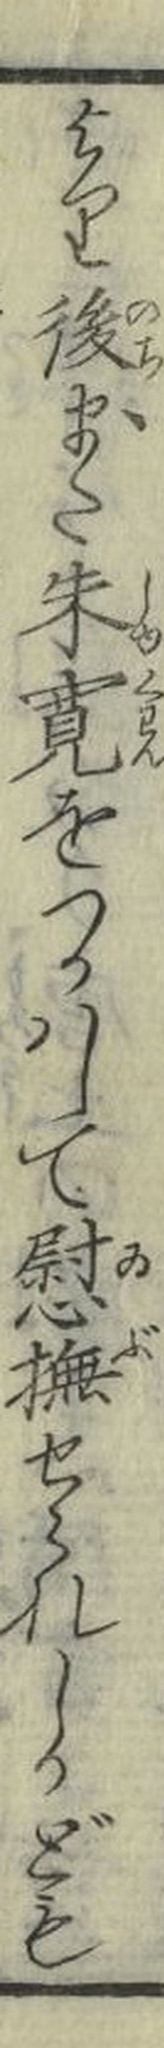より後、また朱寛をつかはして慰撫せられしかども
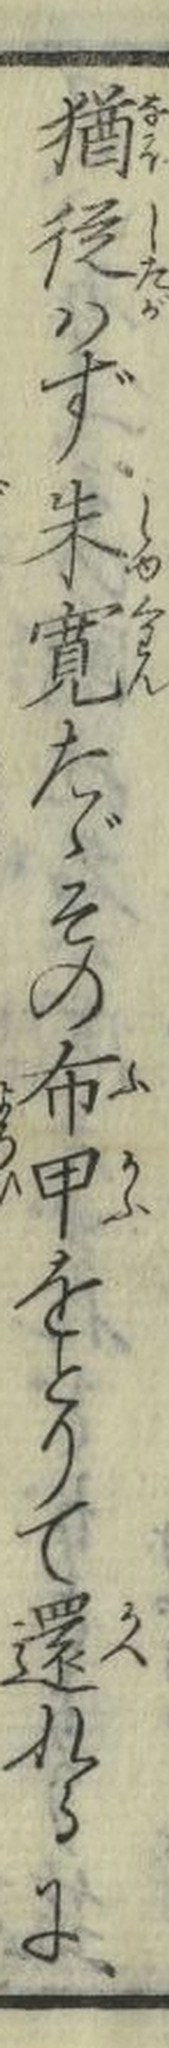猶従はず、朱寛たゞその布甲をとりて還れるに、
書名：琉球入貢紀畧
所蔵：University of the Ryukyus Library
